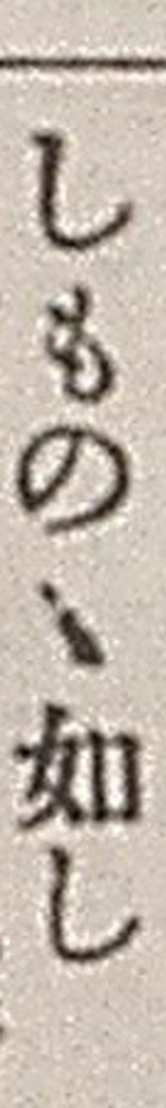しものゝの如し
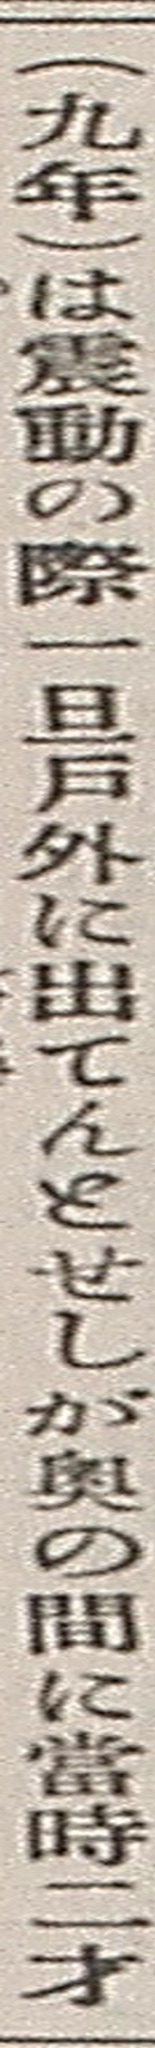を震動の際一旦戸外に出てんとせしが奥の間に当時二才
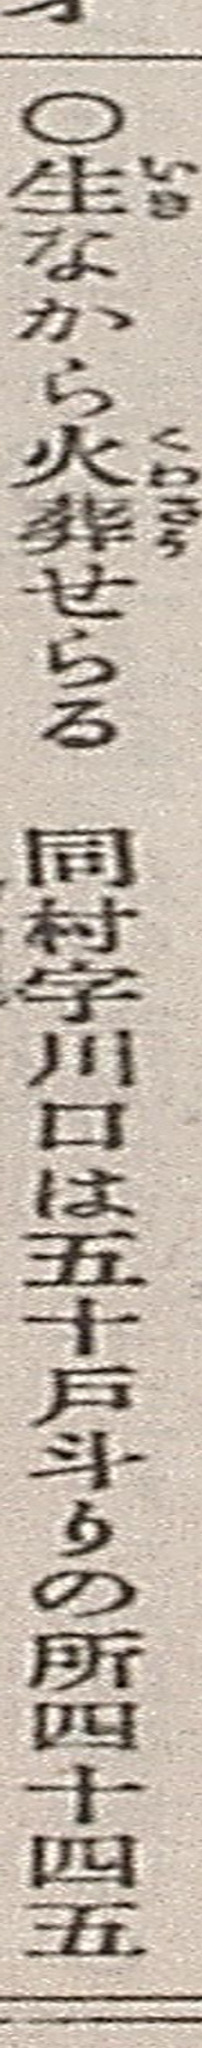〇生なから火葬せらる同村字川口は五十戸斗りの所四十四五
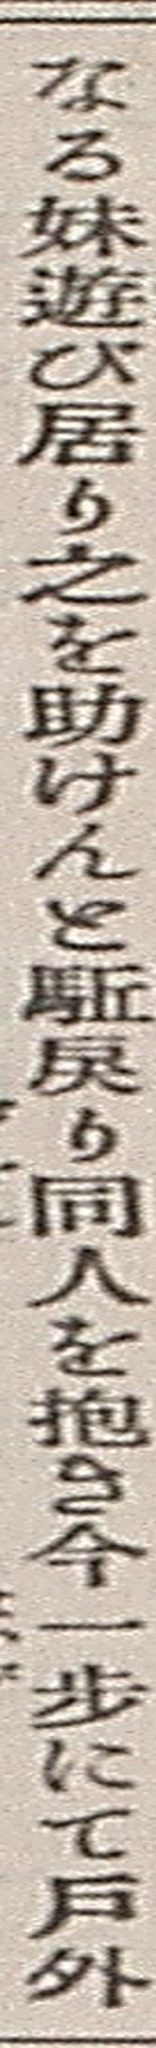なる妹遊び居り之を助けんと駈戻り同人を抱き今一歩にて戸外
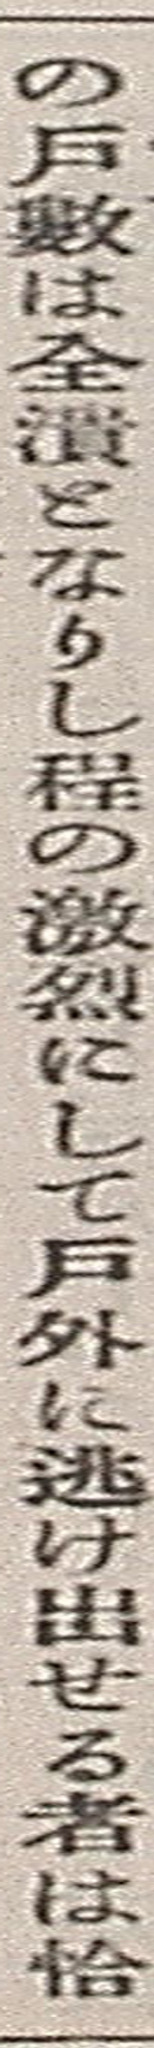の戸数は全潰となりし程の激烈にして戸外に逃け出せる者は恰
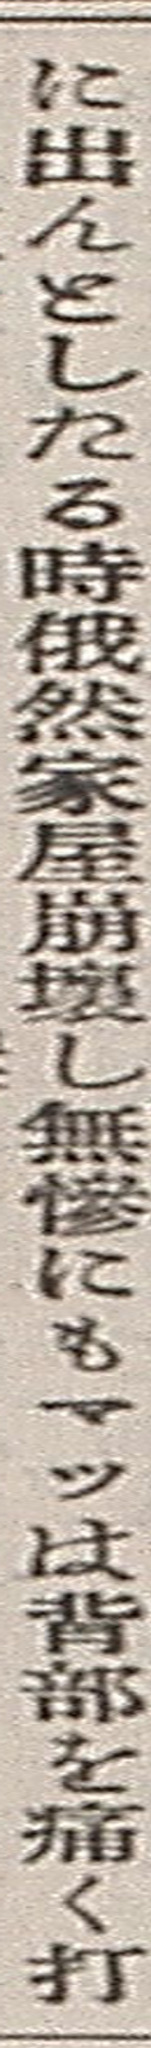に出んとしたる時俄然家屋崩壊し無惨にもマツは背部を痛く打
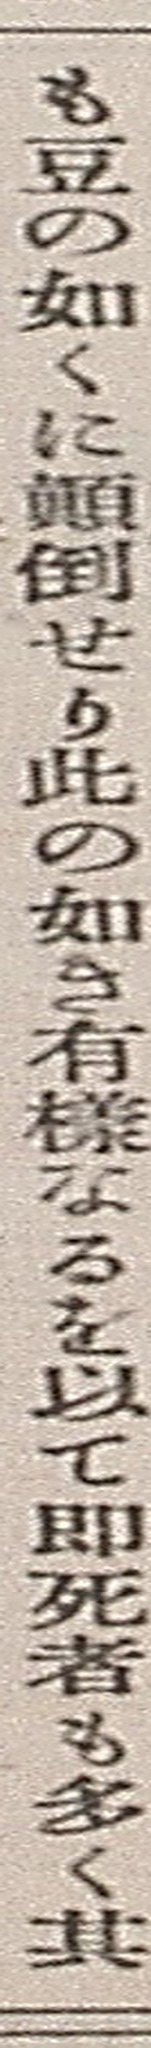も豆の如くに顚倒せり此の如き有様なるを以て即死者も多く其
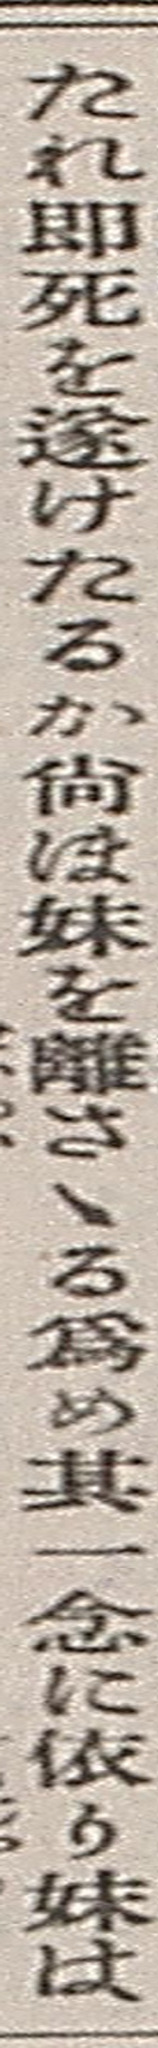たれ即死を遂けたるか尚ほ妹を離さゝる為め其一念に依り妹は
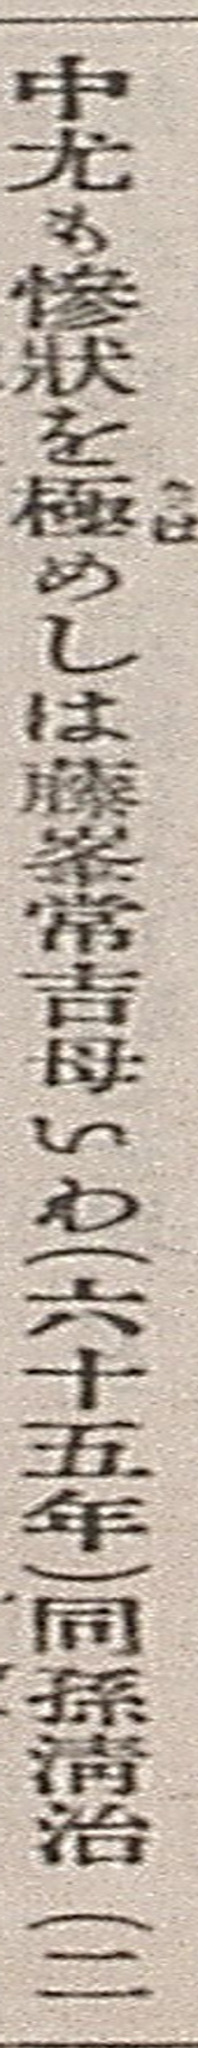中尤も惨状を極めしは藤峯常吉母いわ同孫清治（ニ
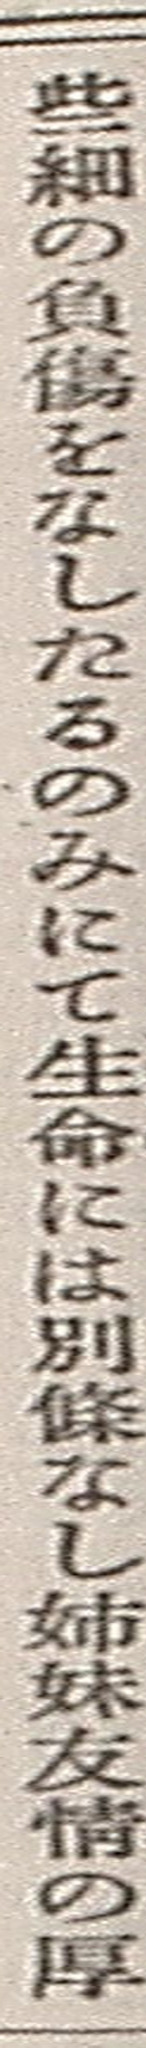些細の負傷をなしたるのみにて生命には別条なし姉妹友情の厚
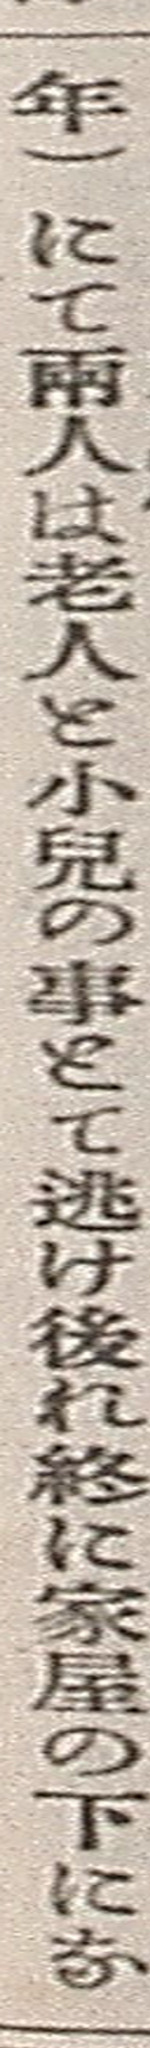年）にて両人は老人と小児の事とて逃け後れ終に家屋の下にな
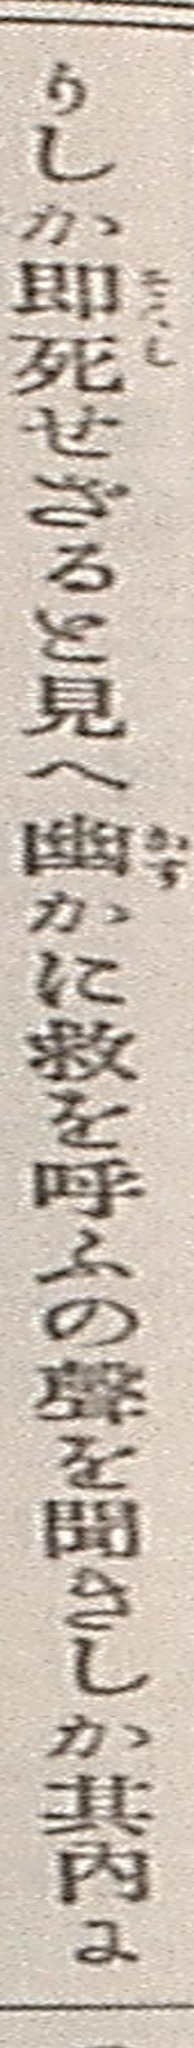りしか即死せざると見へ幽かに救を呼ふの声を聞きしか其内に
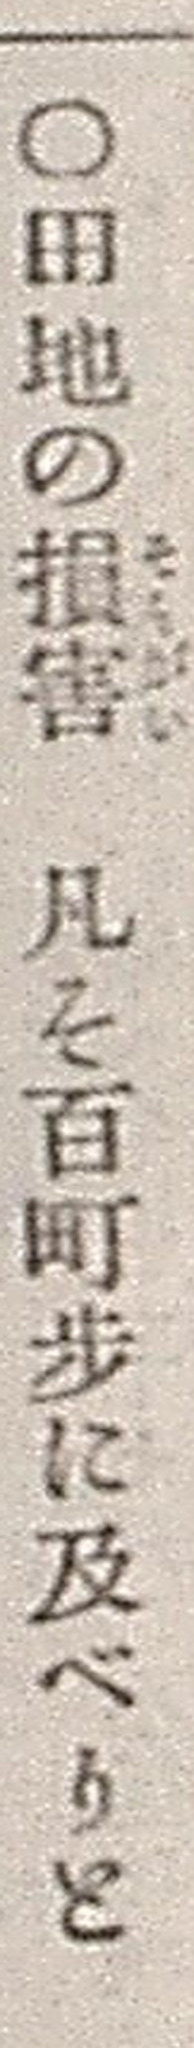〇田地の損害凡そ百町歩に及べりと
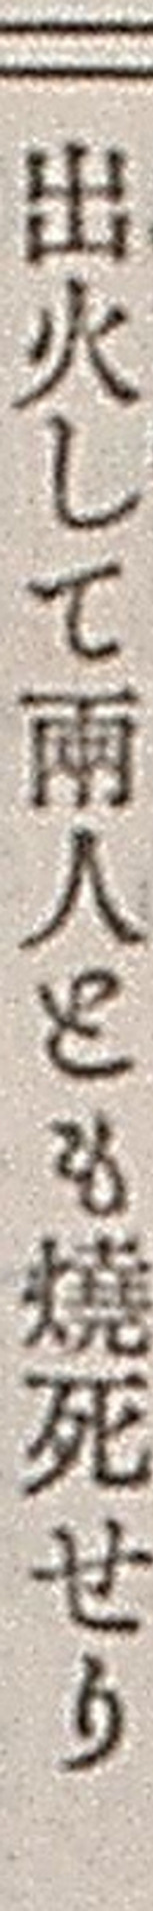出火して両人とも焼死せり
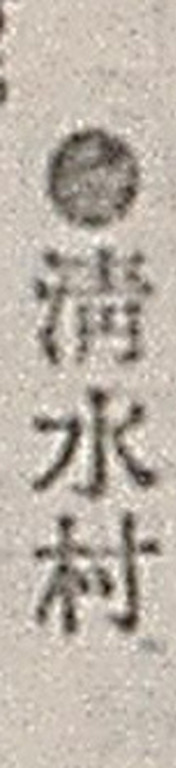●清水村
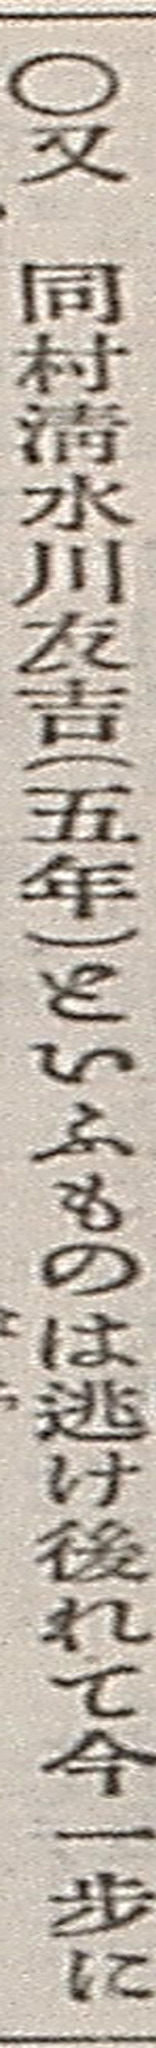〇又同村清水川友吉といふものは逃け後れて今一歩に
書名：風俗畫報臨時増刊第百二十四號　洪水地震被害録（上）
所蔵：東京大学地震研究所図書室 Earthquake Research Institute Library, The University of Tokyo, JAPAN
